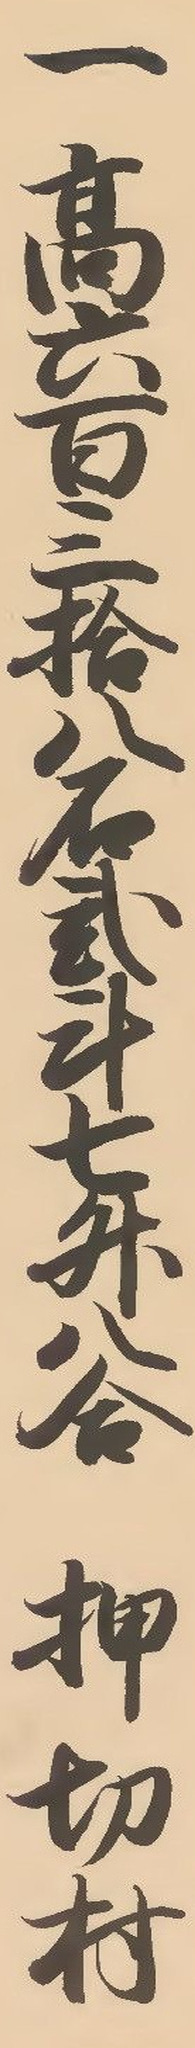一高六百三拾八石弐斗七升八合押切村
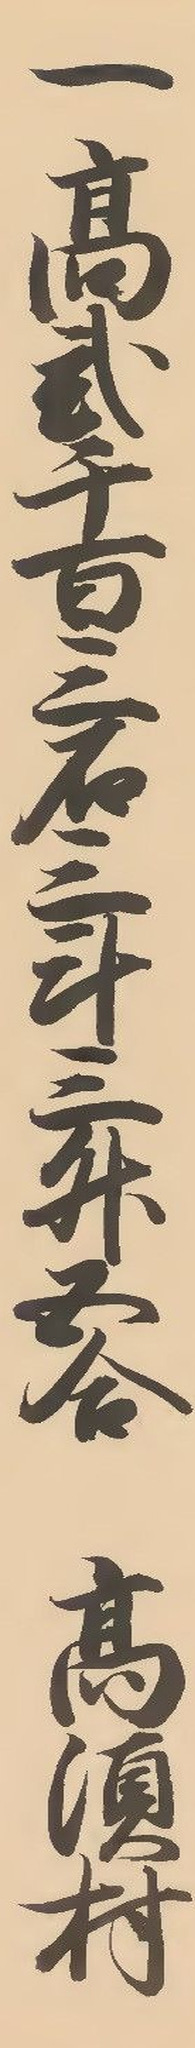一高弐千百三石三斗三升五合高須村
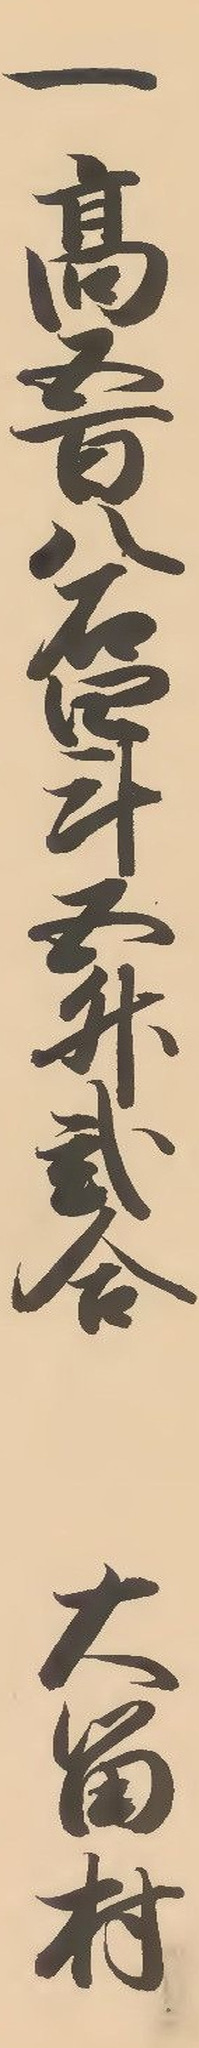一高五百八石四斗五升弐合大留村
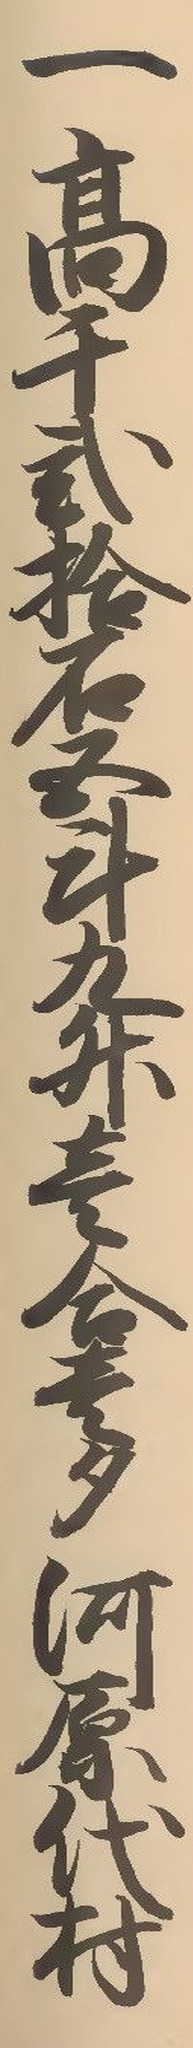一高千弐拾石五斗九升壱合壱勺河原代村
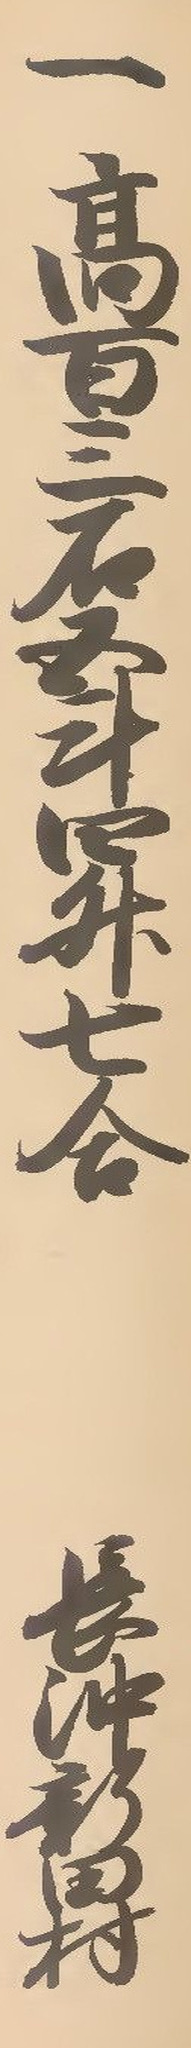一高百三石五斗四升七合長沖新田村
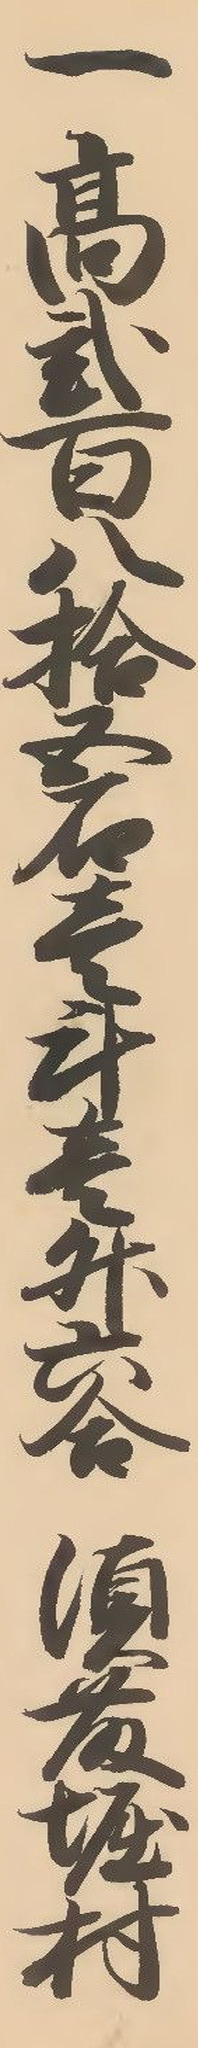一高弐百八拾五石壱斗壱升六合須藤堀村
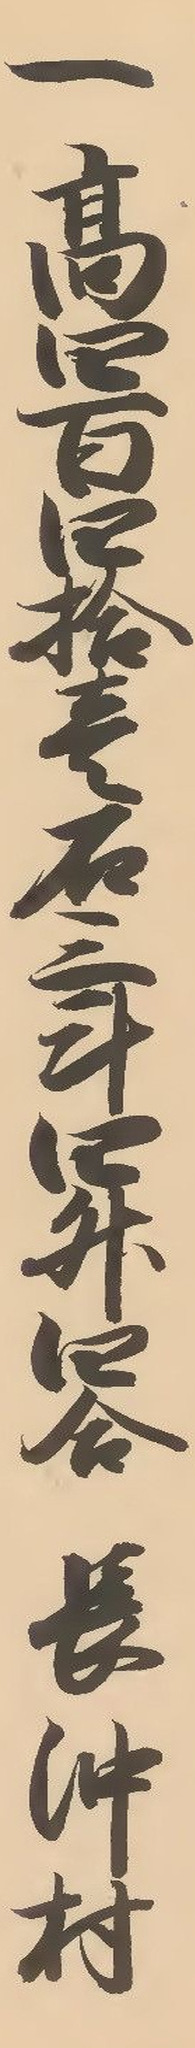一高四百四拾壱石三斗四升四合長沖村
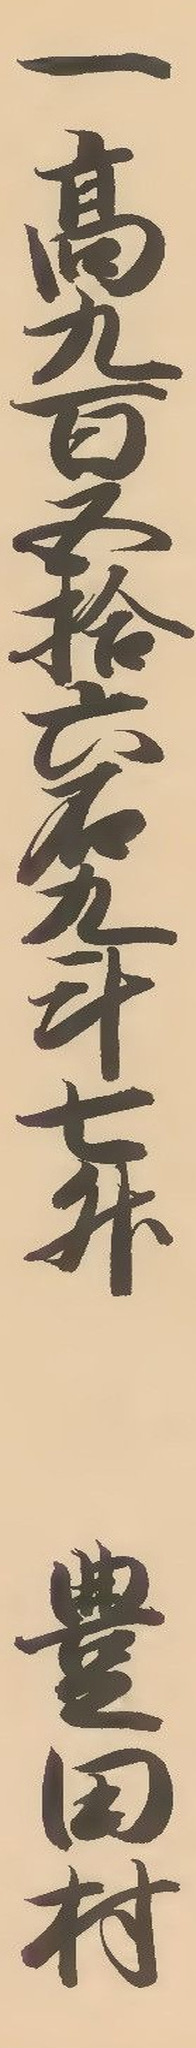一高九百五拾六石九斗七升豊田村

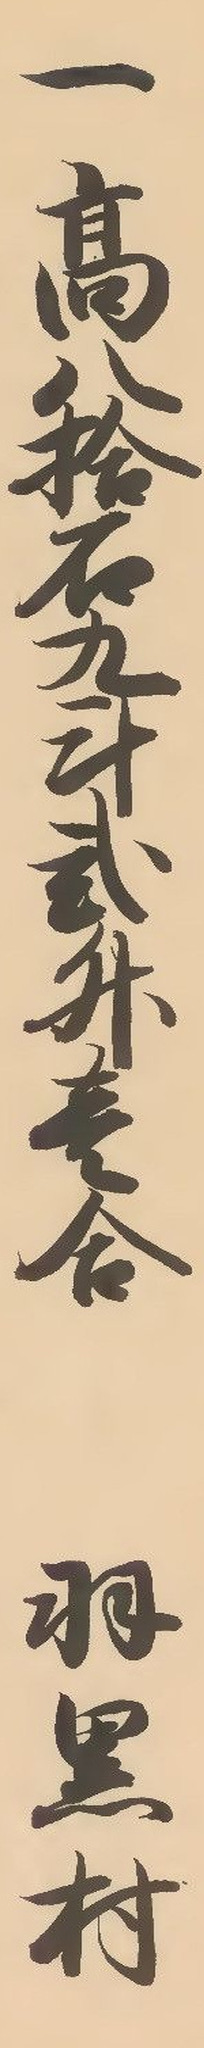一高八拾石九斗弐升壱合羽黒村
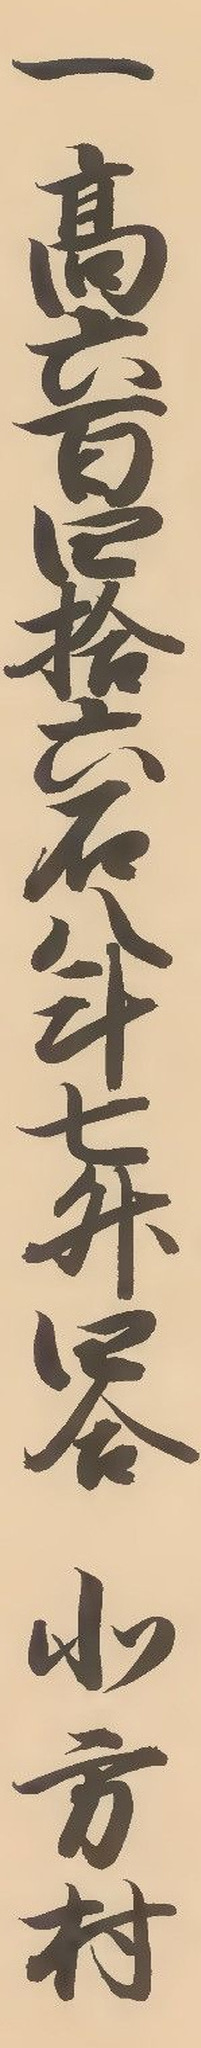一高六百四拾六石八斗七升四合北方村
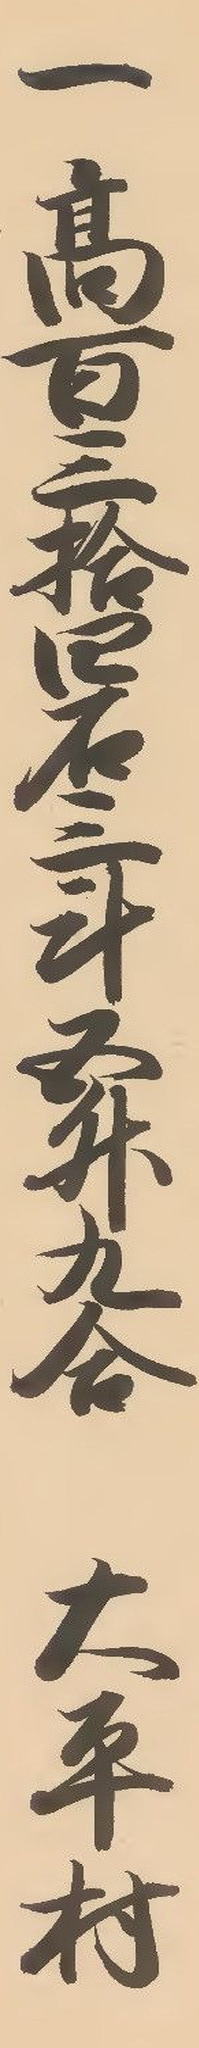一高百三拾四石三斗五升九合大平村
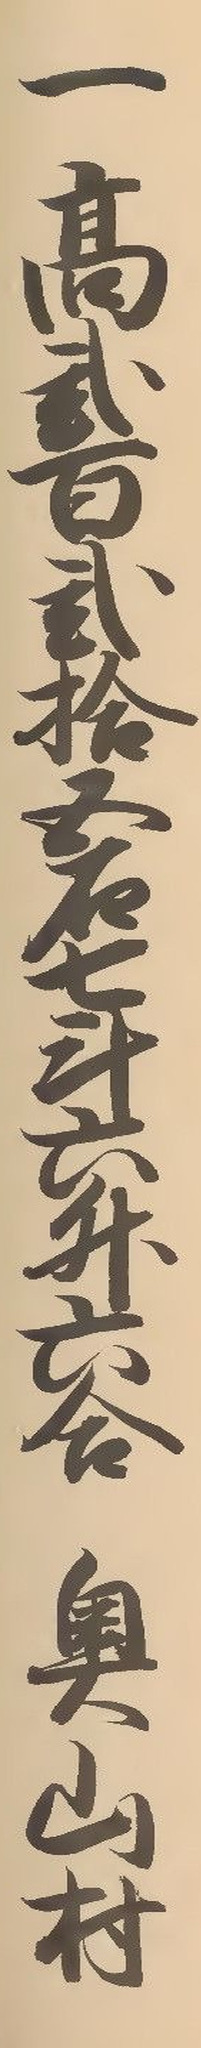一高弐百弐拾五石七斗六升六合奥山村
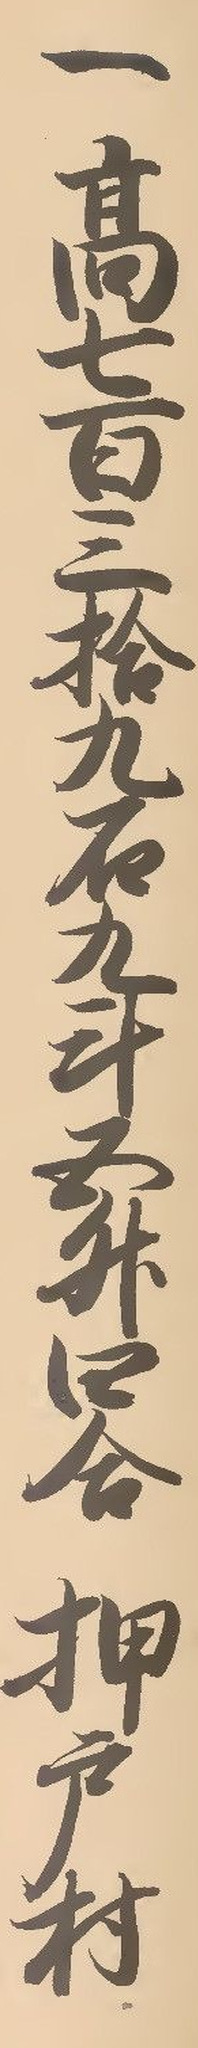一高七百三拾九石九斗五升四合押戸村
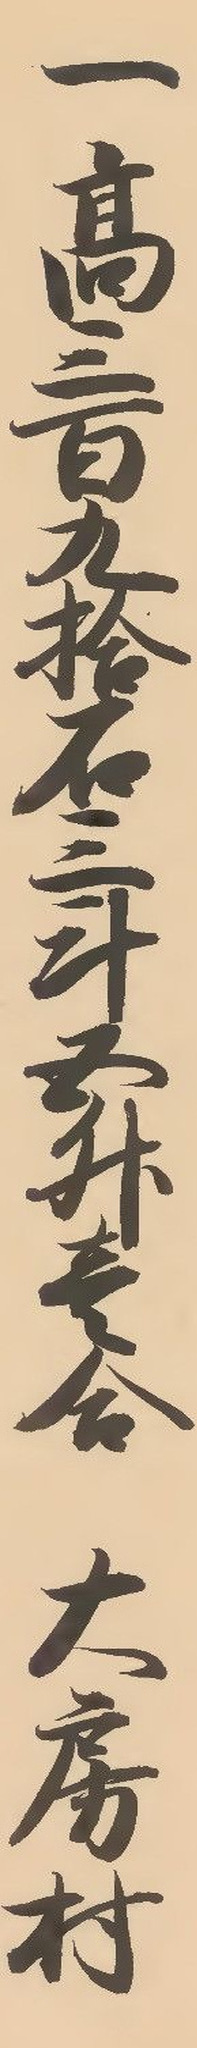一高三百九拾石三斗五升壱合大房村
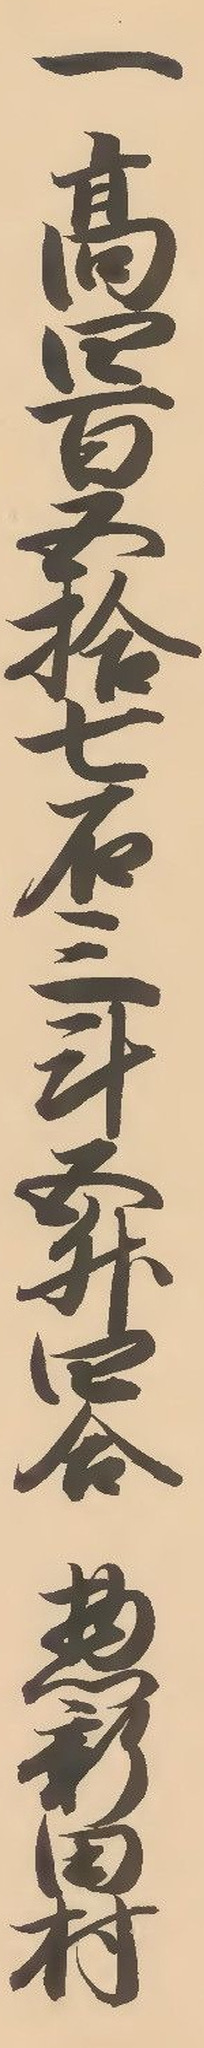一高四百五拾七石三斗五升四合惣新田村
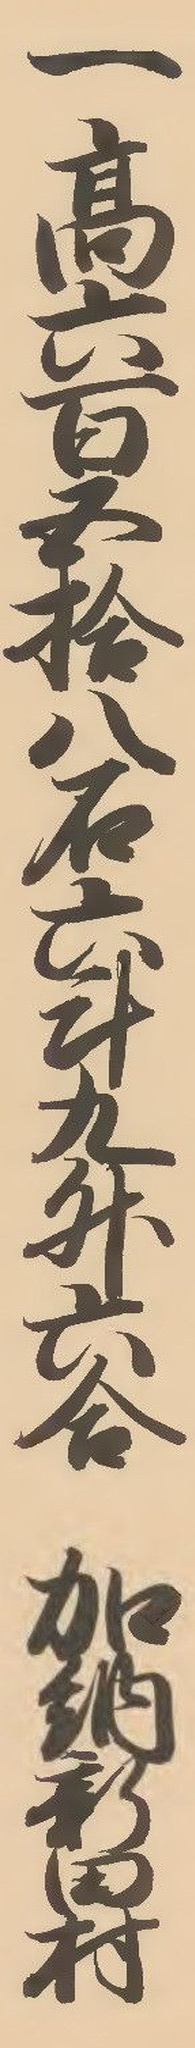一高六百五拾八石六斗九升六合加納新田村
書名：下総国郷帳
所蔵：国立公文書館 National Archives of Japan
